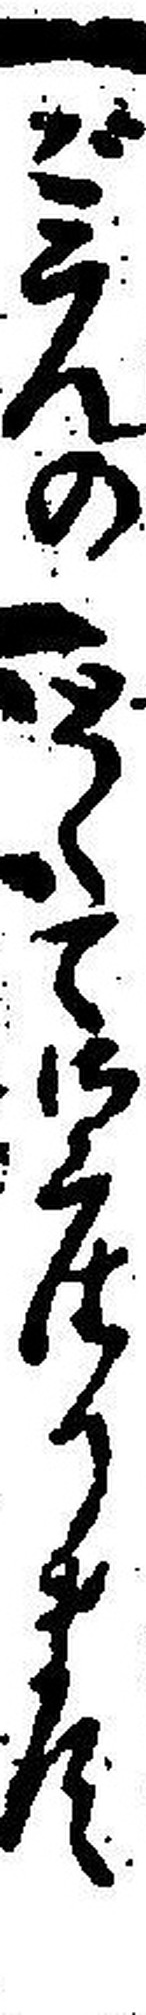ごこんのどｋて御座りあす
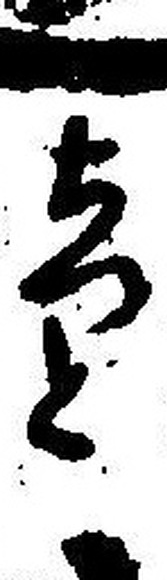ちつと
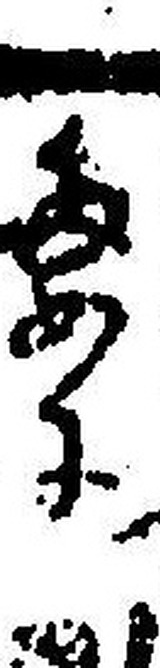ために
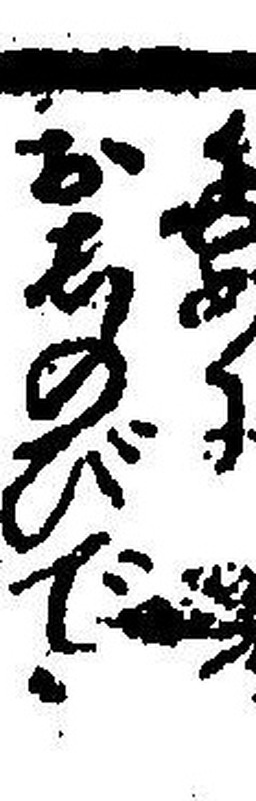おしのびで
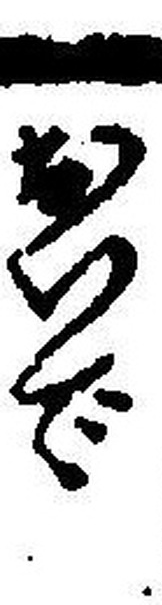おいで
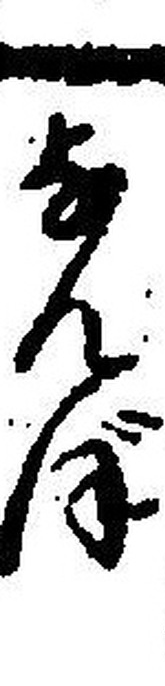なんぼ
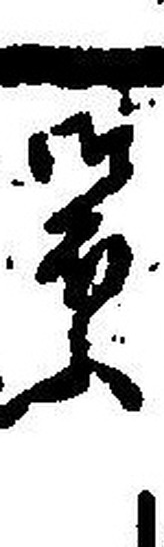御ほふ
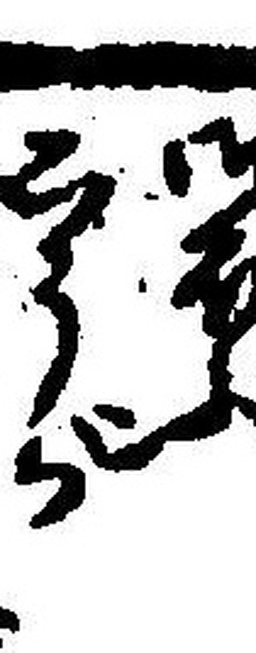こうが
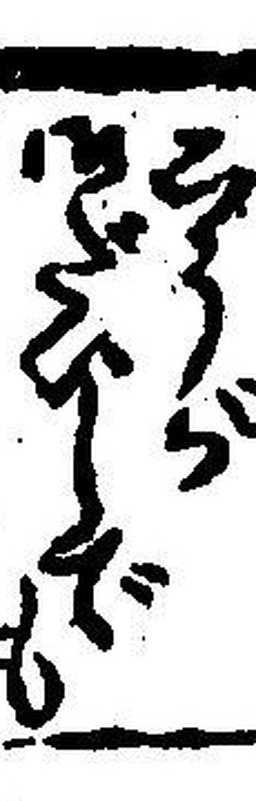あいしでも
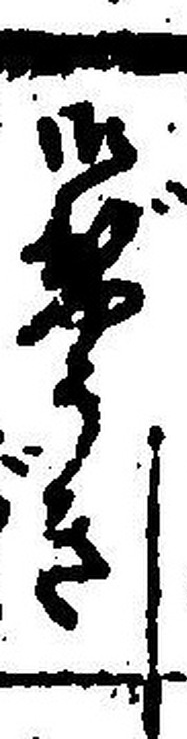御びやうき
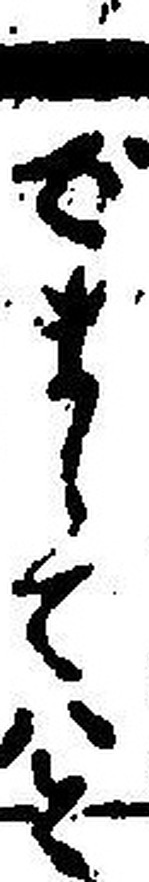でましてはと
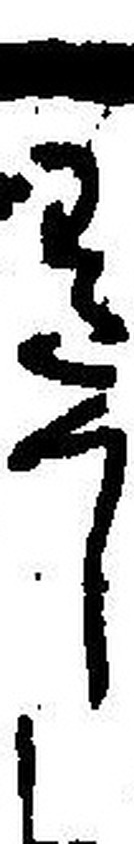わたくし
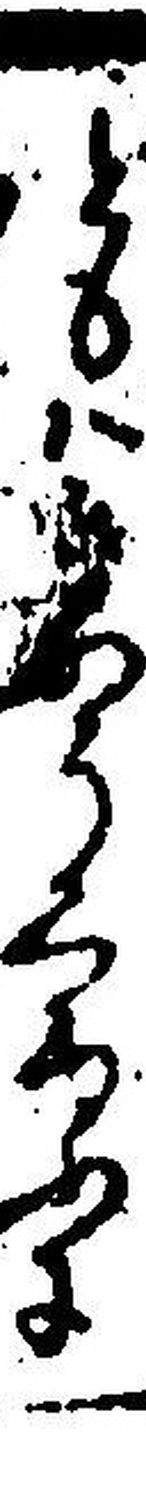どもはきつくろふに
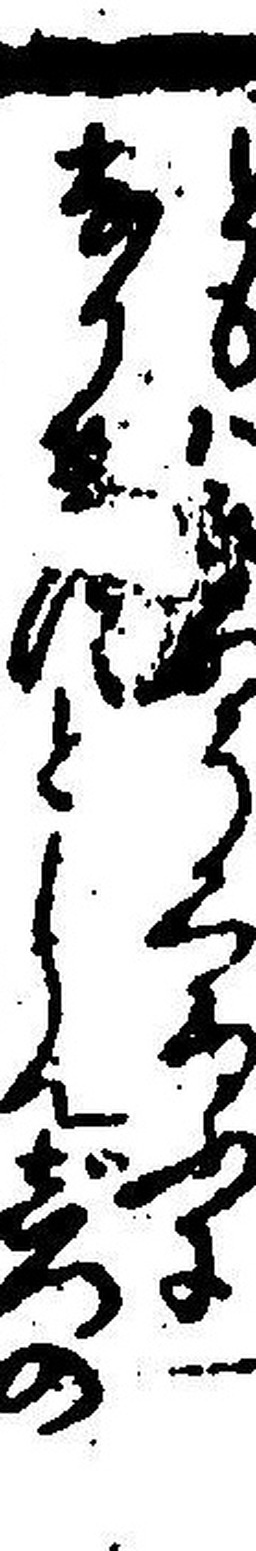なりますとしんじつの
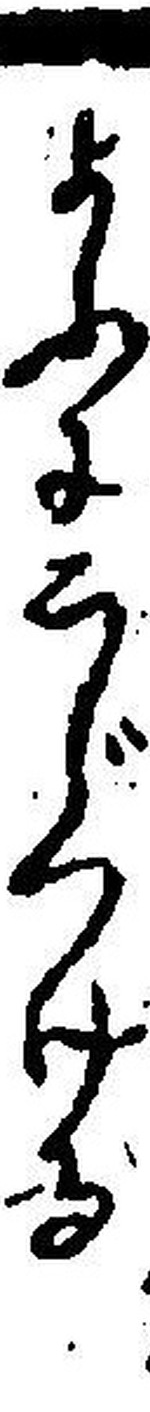よふにこじつける

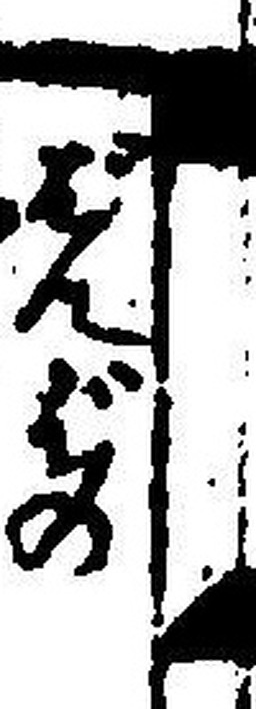ばんばの
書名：御代参牛時詣 / 市場通笑作
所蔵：東京大学総合図書館 General Library in the University of Tokyo, JAPAN
